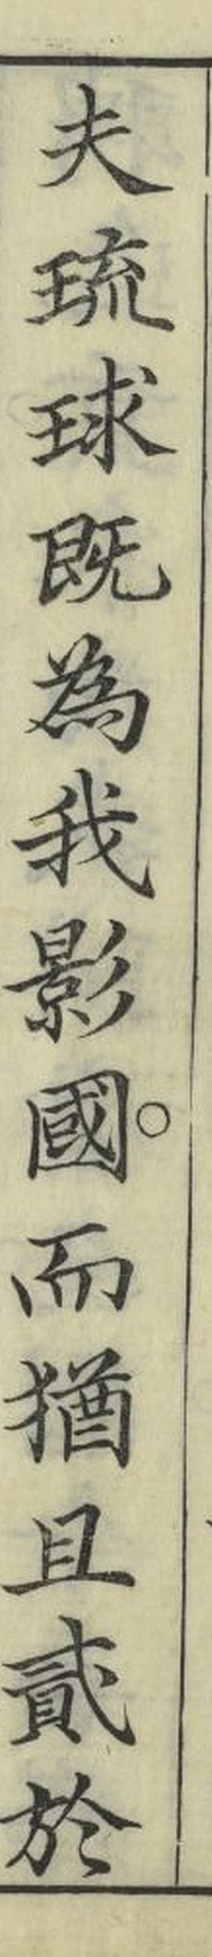夫琉球既為我影國。而猶且貳於
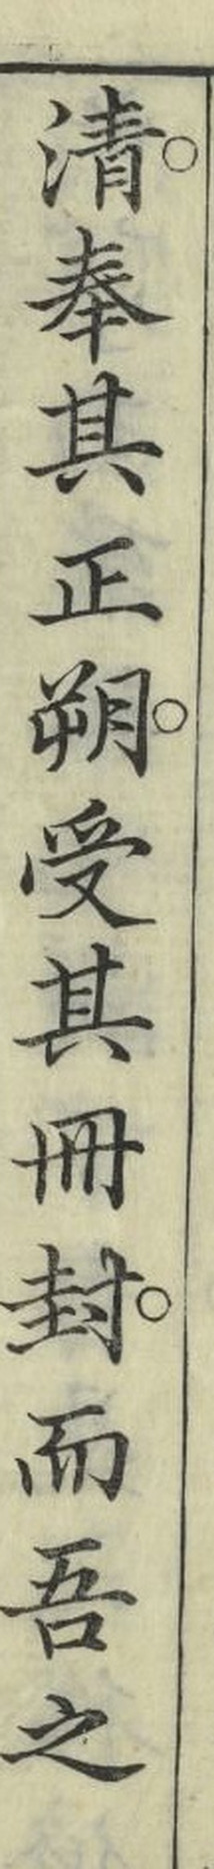清。奉其正朔。受其冊封。而吾之
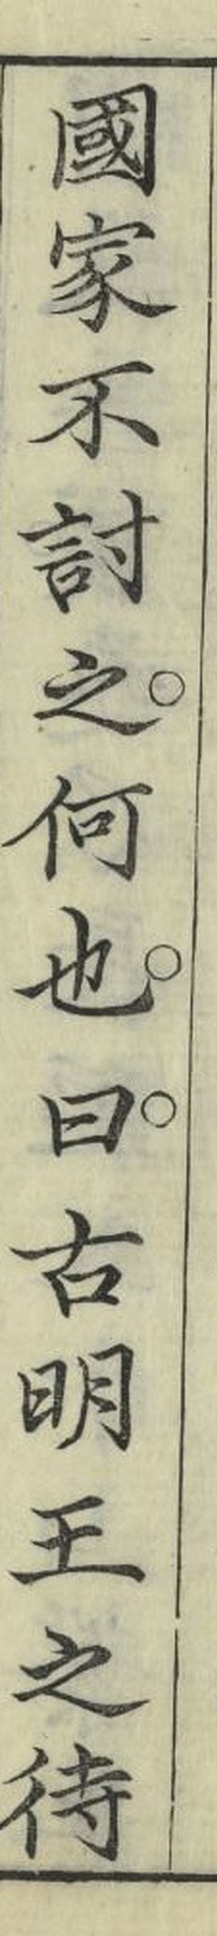國家不討之。何也。曰。古明王之待
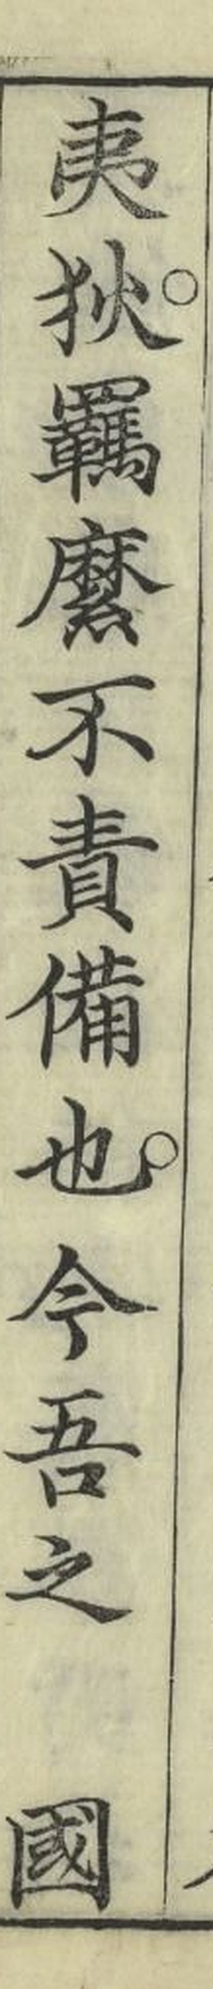夷狄。羈縻不責備也。今吾之國
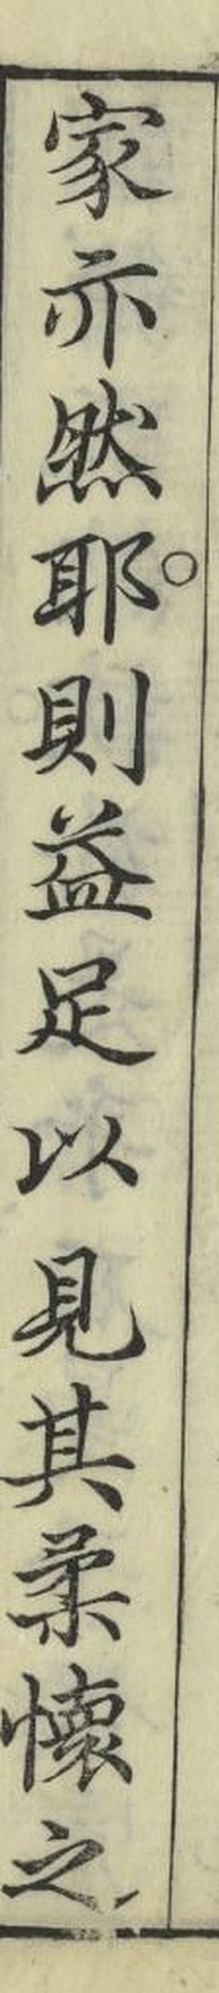家亦然耶。則益足以見其柔懐之
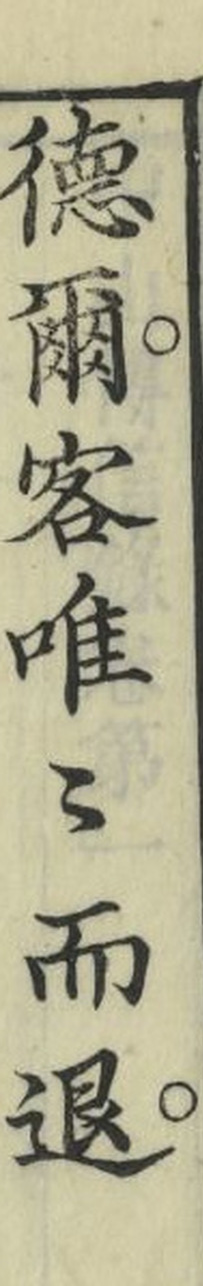德爾。客唯々而退。
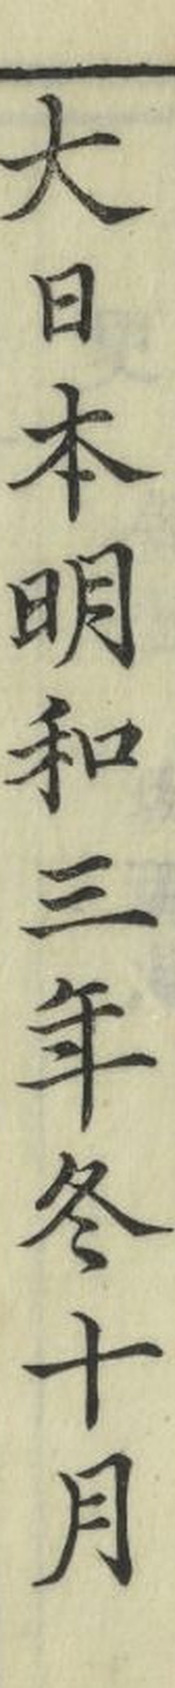大日本明和三年冬十月
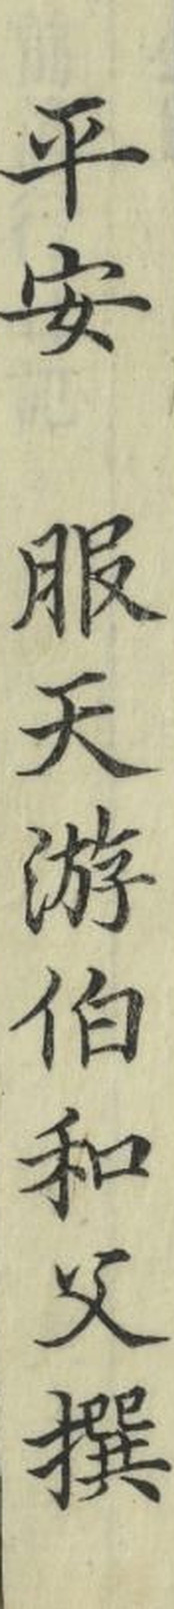平安服天游伯和文撰

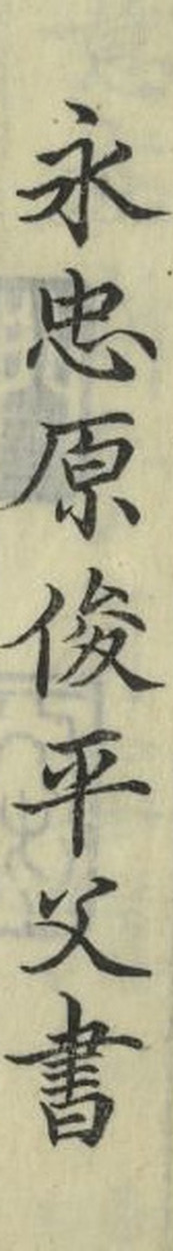永忠原俊平文書
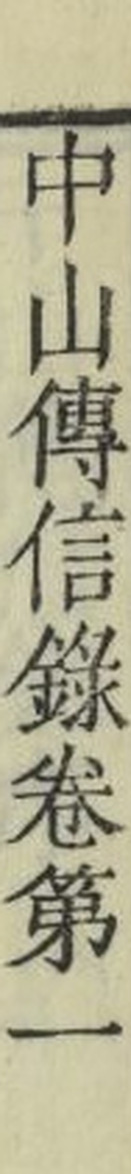中山傳信錄卷第一
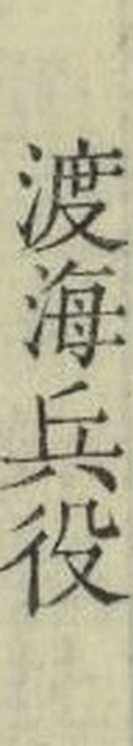渡海兵役
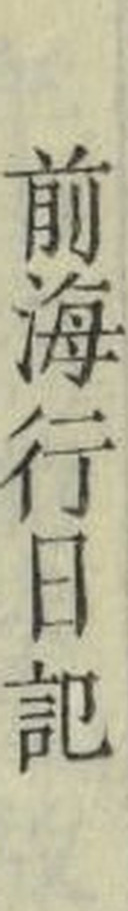前海行日記
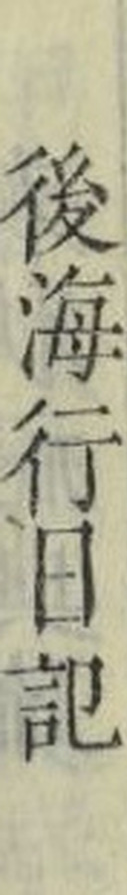後海行日記
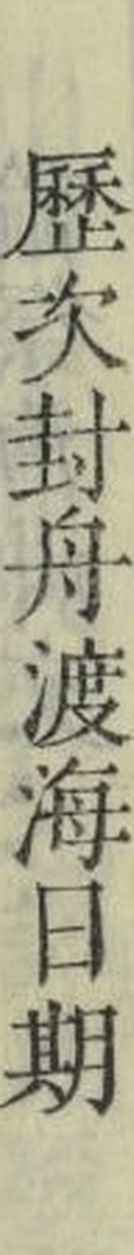歷次封舟渡海日期

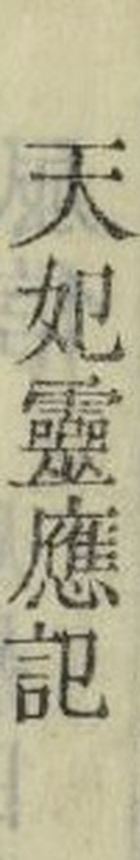天妃靈應記
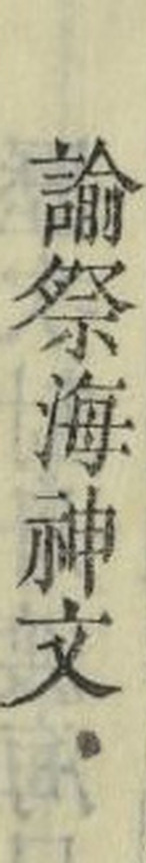諭祭海神文
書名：中山伝信録 巻一
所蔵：University of the Ryukyus Library
